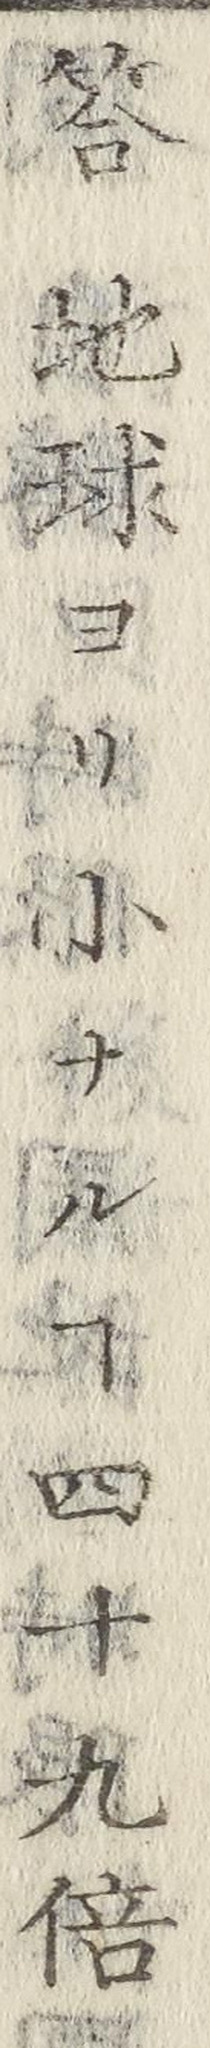答地球ヨリ小ナルコト四十九倍
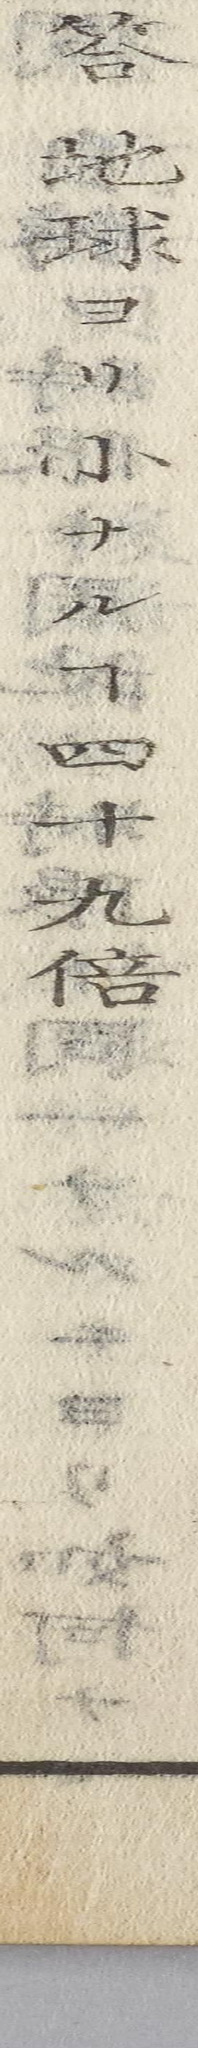答地球ヨリ小ナルコト四十九倍
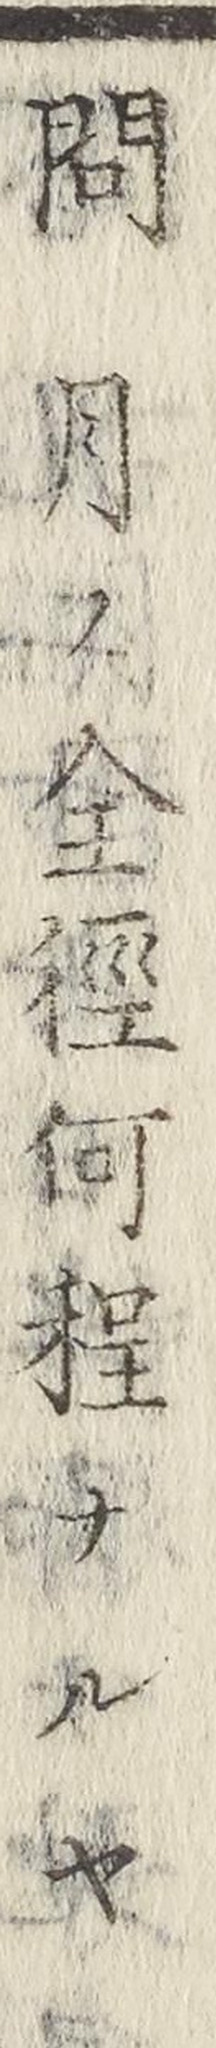問月ノ全径何程ナルヤ
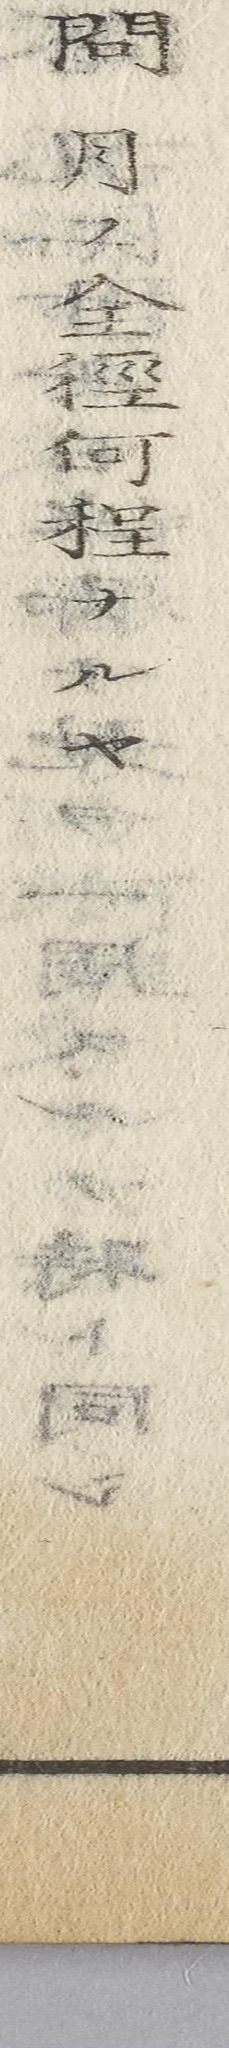問月ノ全径何程ナルヤ
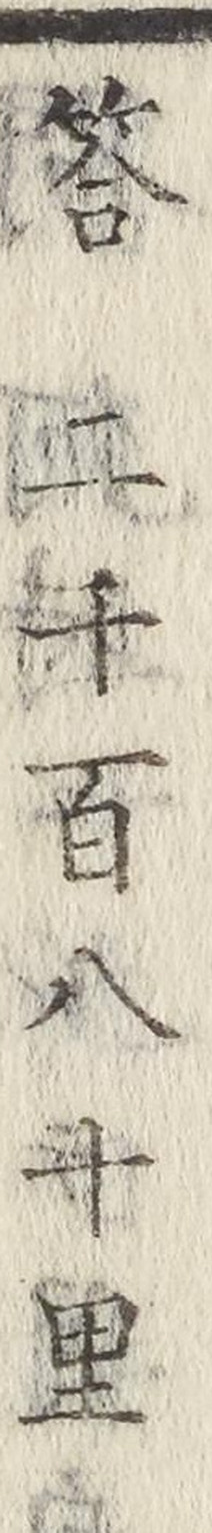答二千百八十里
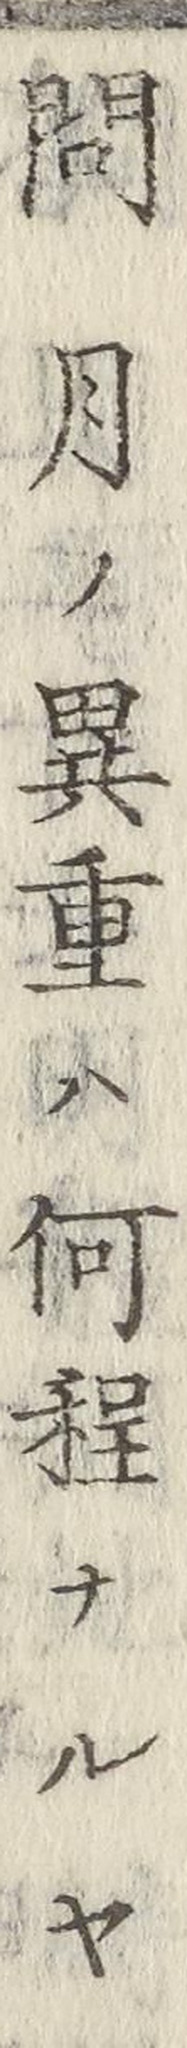問月ノ異重ハ何程ナルヤ
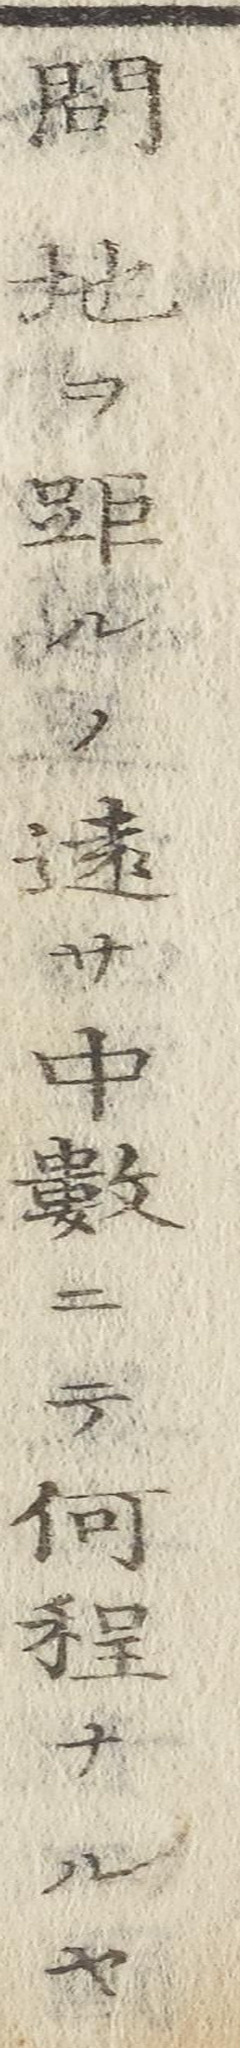問地ヲ距ルノ遠サ中数ニテ何程ナルヤ

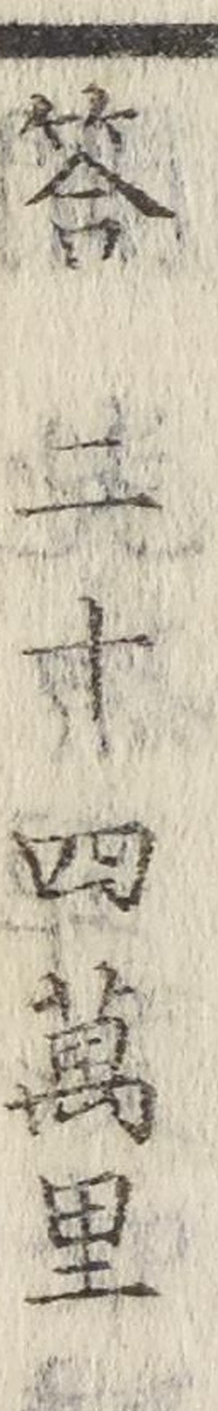答二十四万里
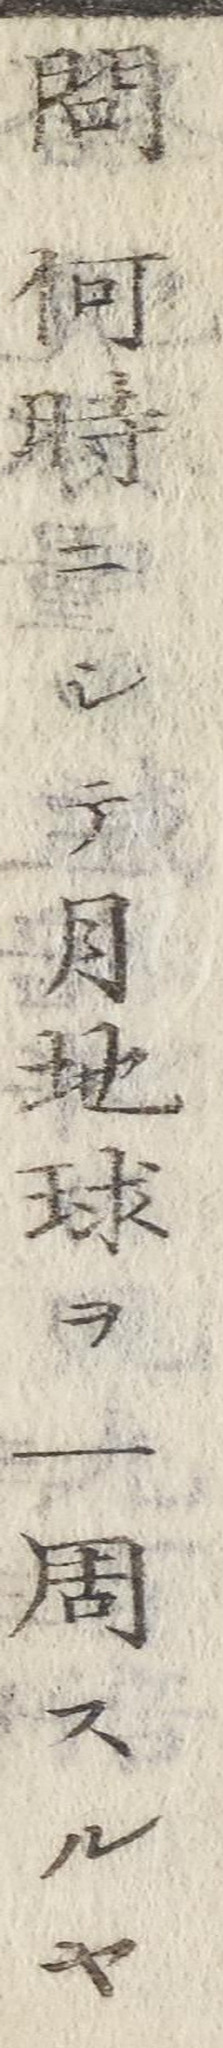問何時ニシテ月地球ヲ一周スルヤ
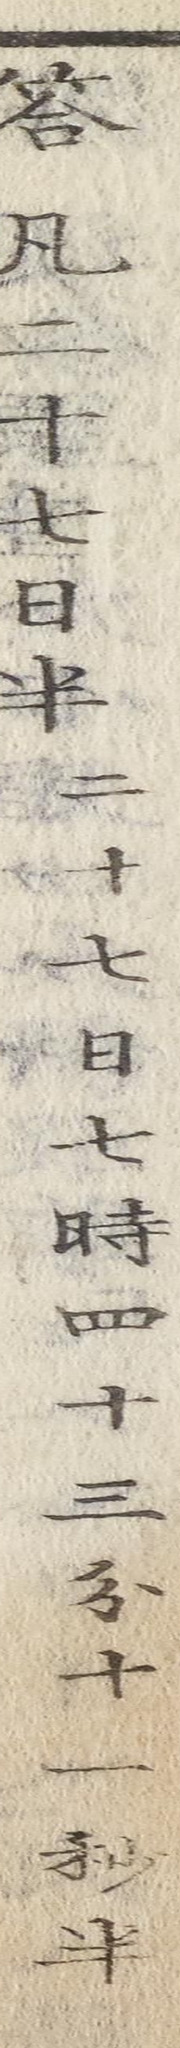答凡二十七日半二十七日七時四十三分十一秒半
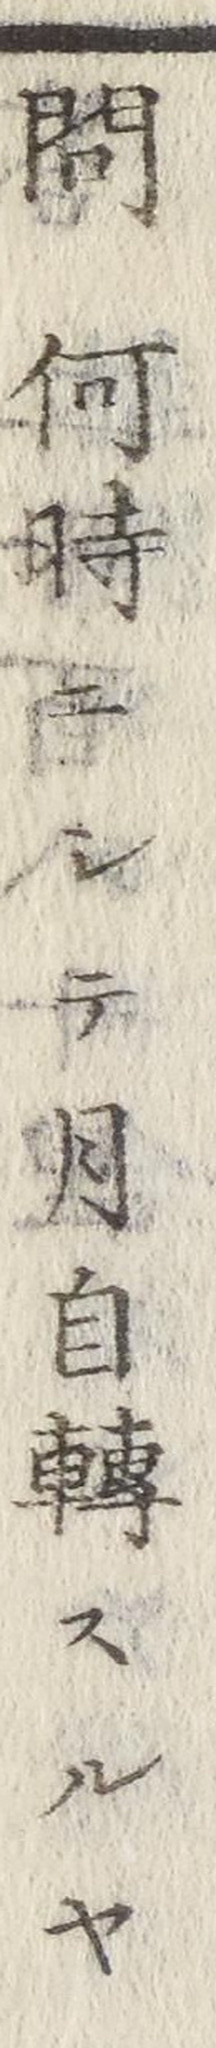問何時ニシテ月自転スルヤ
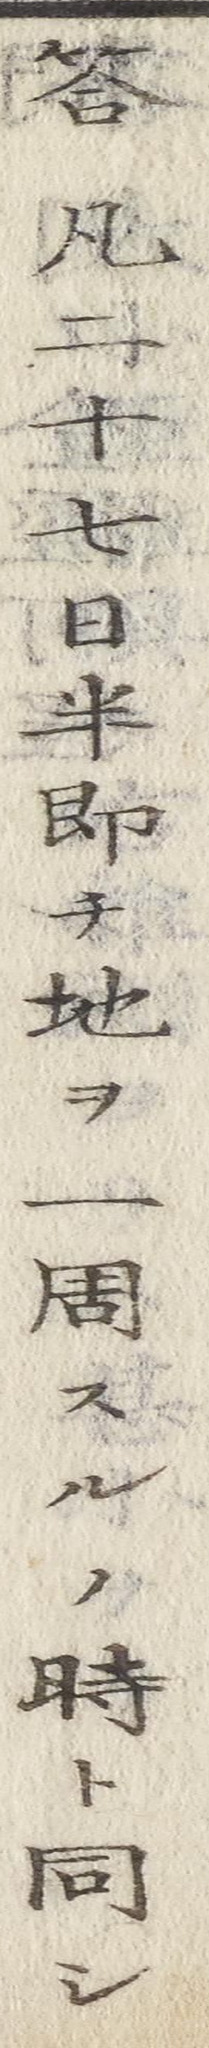答凡二十七日半即チ地ヲ一周スルノ時ト同シ
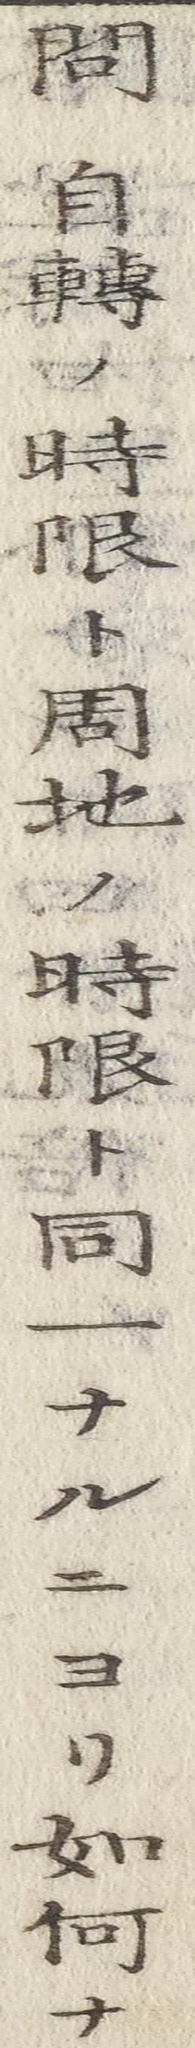問自転ノ時限ト周地ノ時限ト同一ナルニヨリ如何ナ
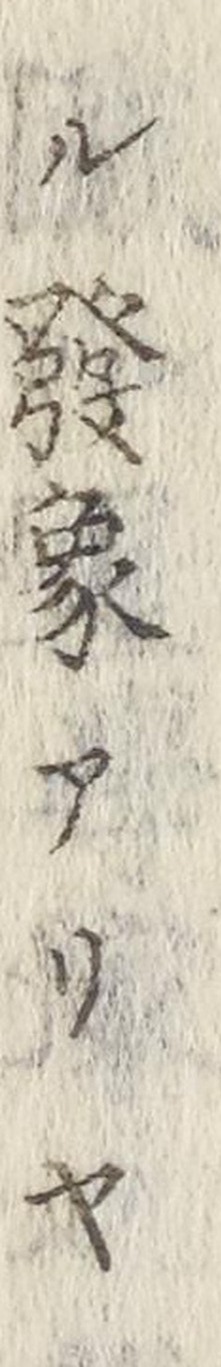ル発象アリヤ
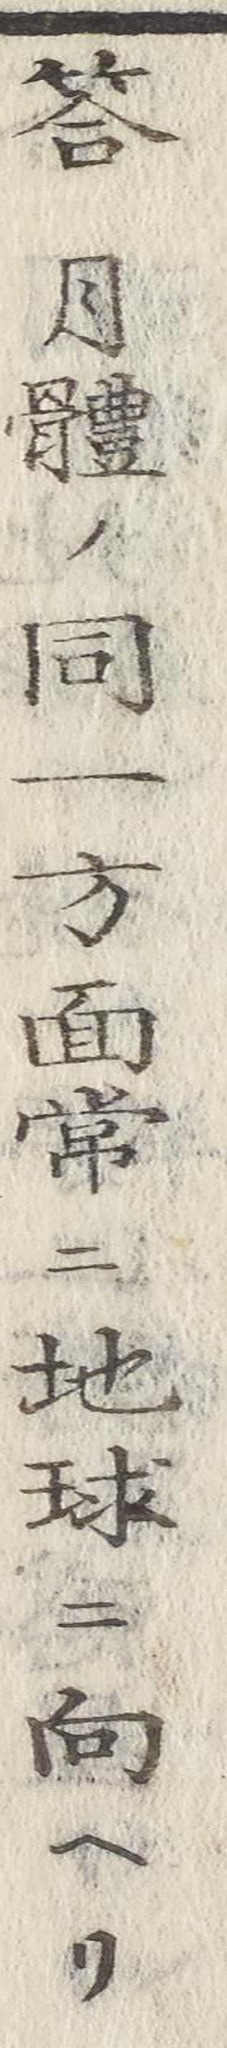答月体ノ同一方面常ニ地球ニ向ヘリ
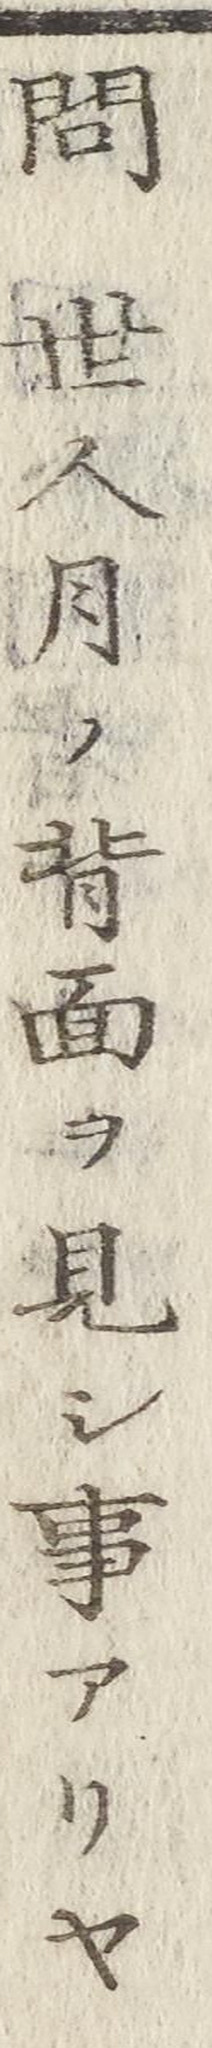問世人月ノ背面ヲ見シ事アリヤ
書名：星学圖説　下
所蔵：東京大学地震研究所図書室 Earthquake Research Institute Library, The University of Tokyo, JAPAN
